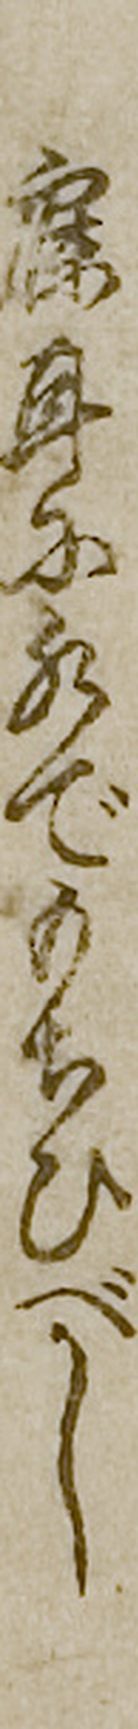寝耳に水でもちひべし
